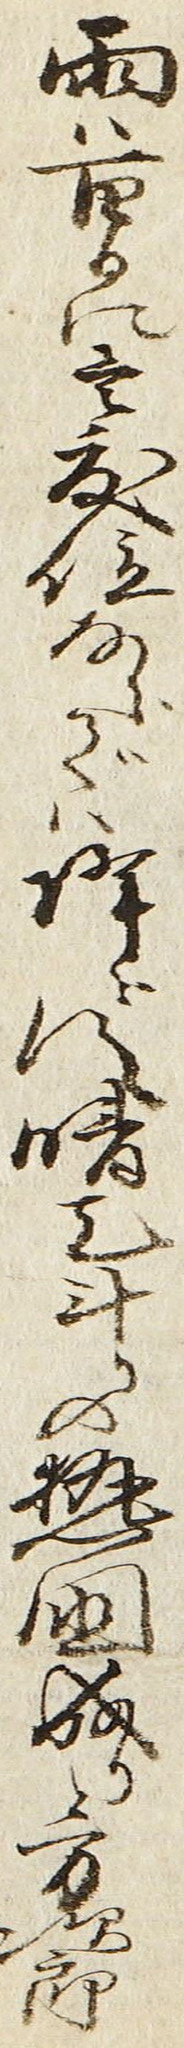雨ハ百日に壱度位ならでハ降らす晴天計りの熱国成りと万次郎
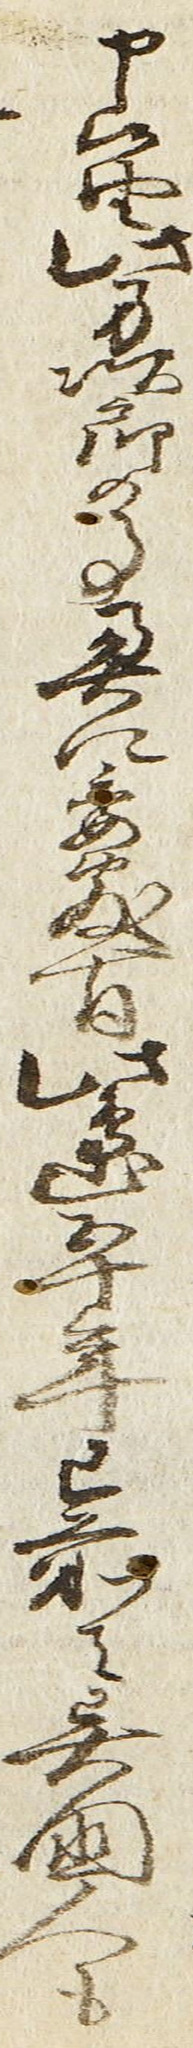申候由此万次郎の事奥に委敷有此島五十年已前者異国人も
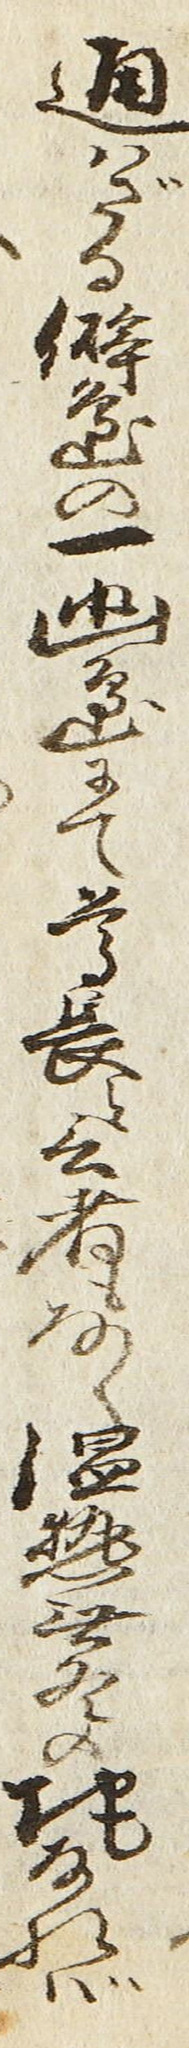通ハざる僻島の一幽島にて尊長と言者もなく温熱無冬の地なれバ
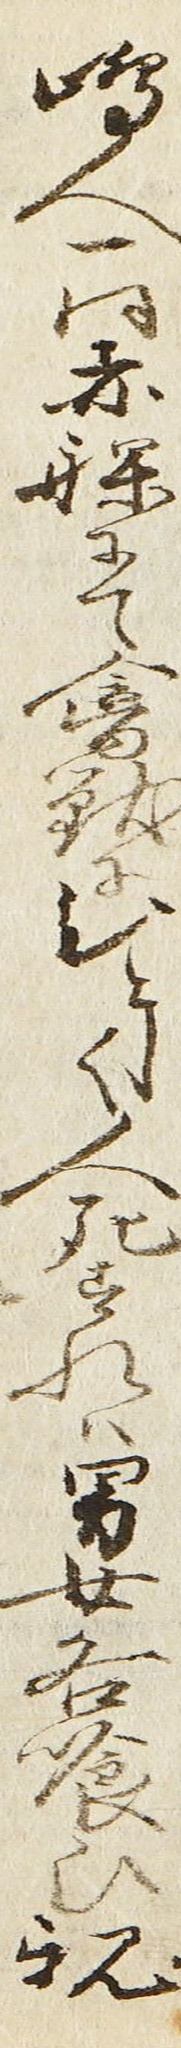島人一同赤裸にて禽獣にひとしく人死すれハ男女各喰ひ親
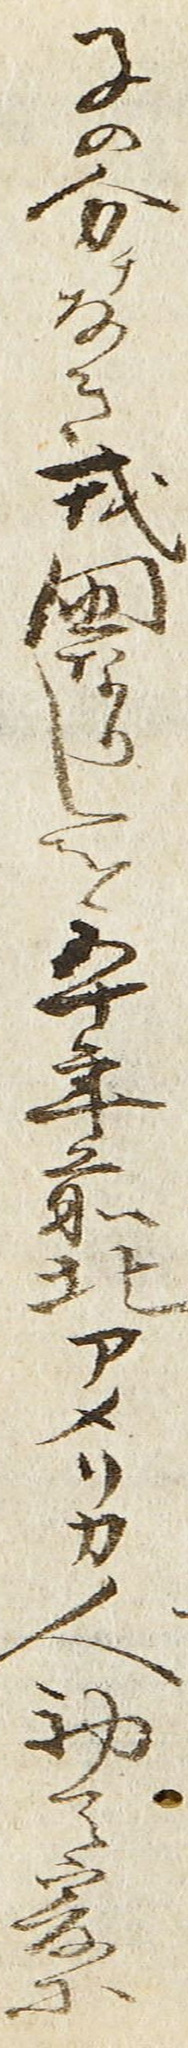子の分チなき戎国なりしを五十年前北アメリカ人初て爰に
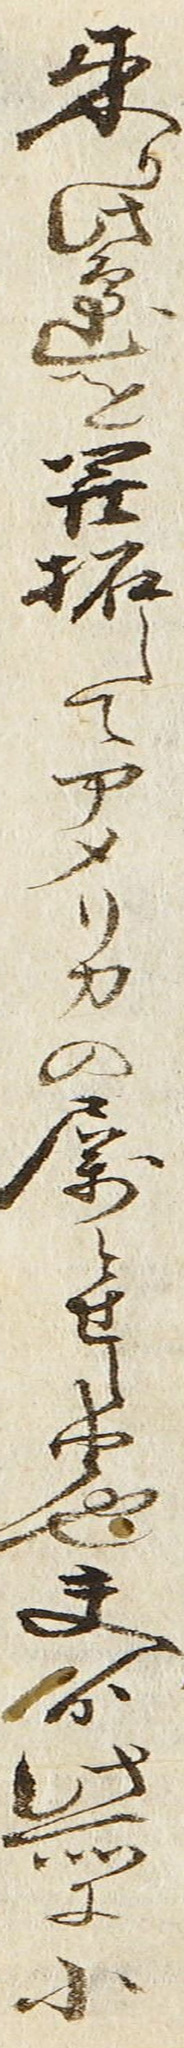来り此島を開拓してアメリカの属とせし由也夫ゟ此所に小
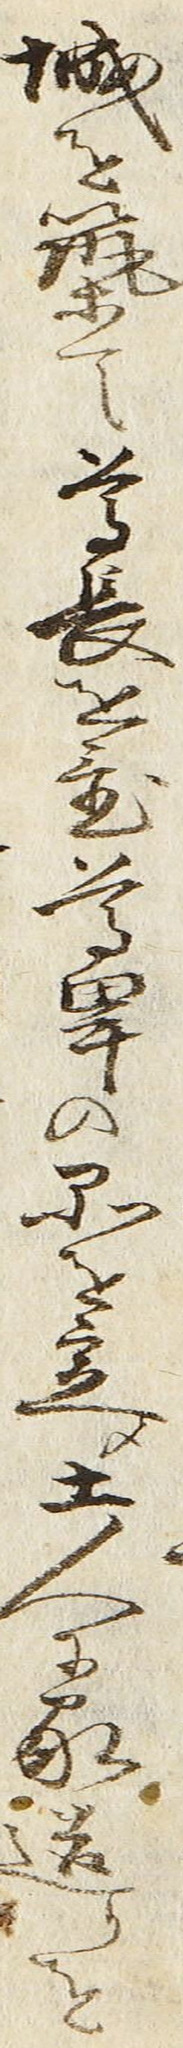城を築て尊長を置尊卑の品を定メ土人に家造りを
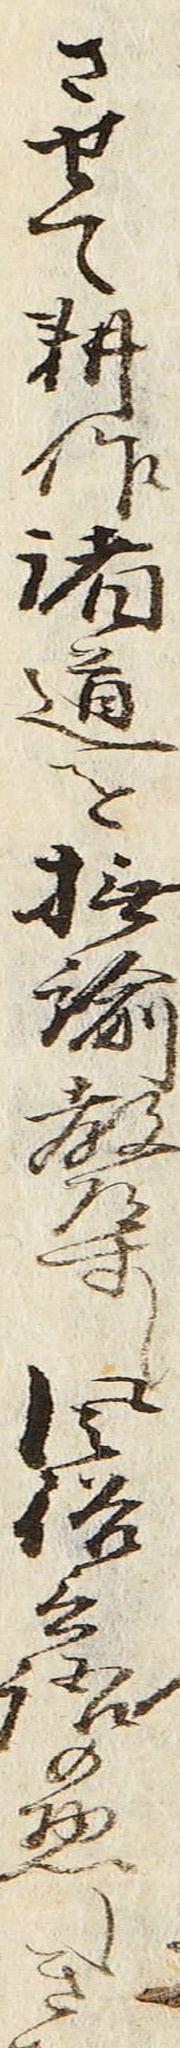させて耕作諸道を撫諭教導し風俗言語の悪しきを
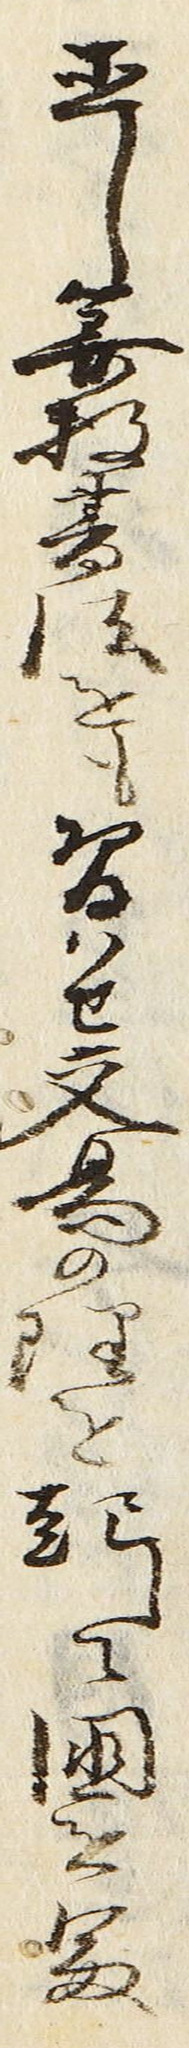直し算数書法をも習ハセ交易の理を起して国を富
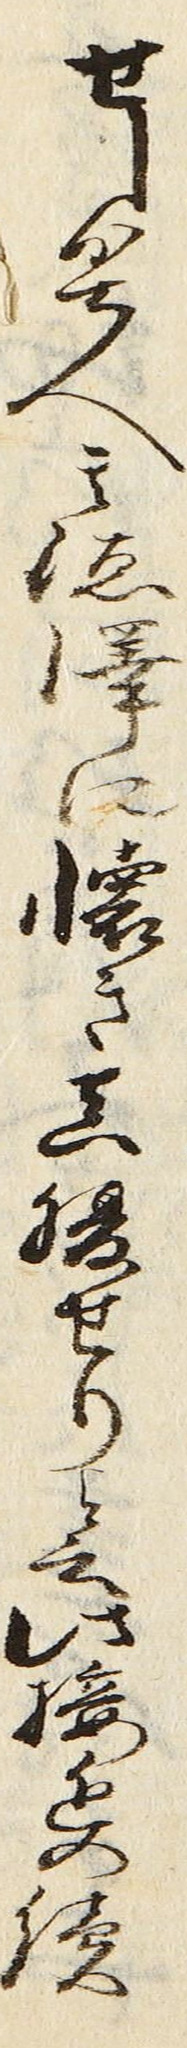せしゟ土人其徳沢に懐き真服せりと云此接近の続
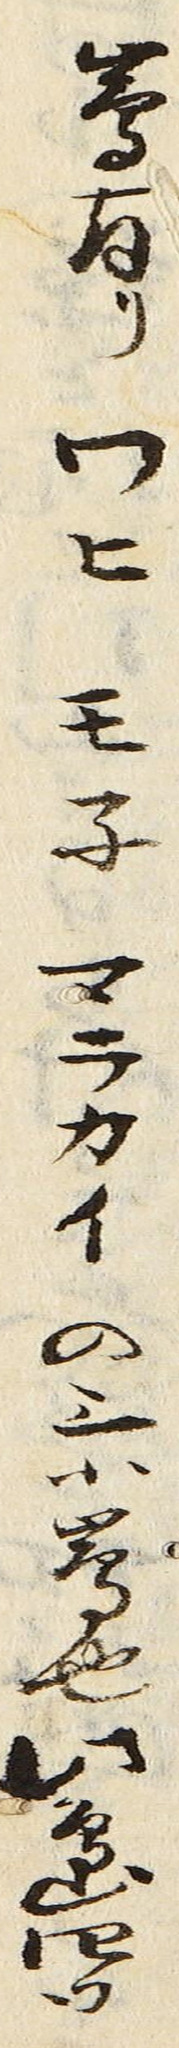島有りワヒモネマラカイの三小島也此島四ツ
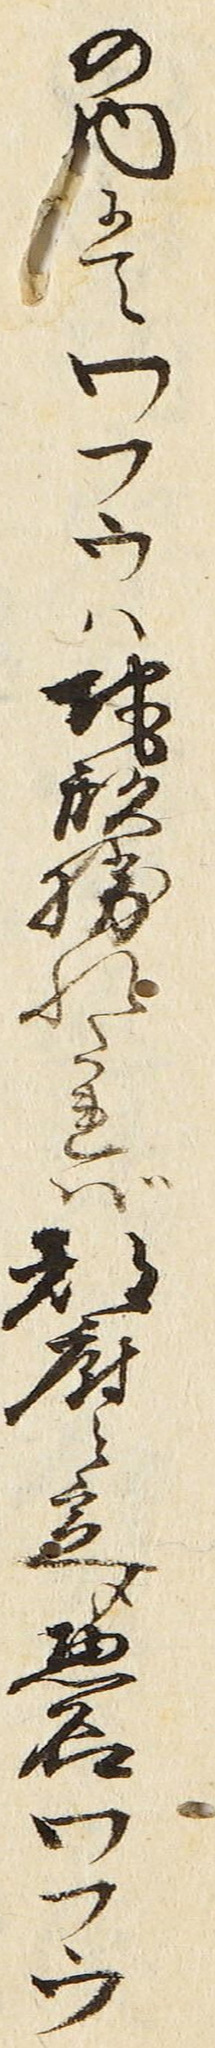の内にてワフウハ地形勝れたれバ都府と定メワフウ
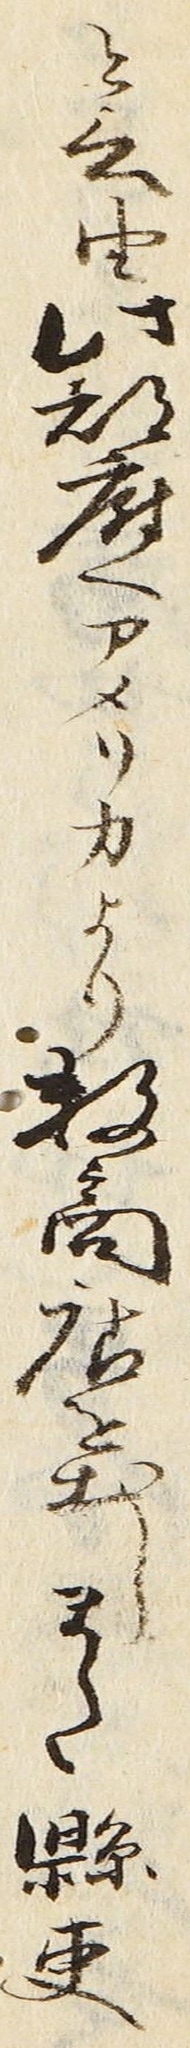と云由此都府へアメリカより数商店を出しまた県吏
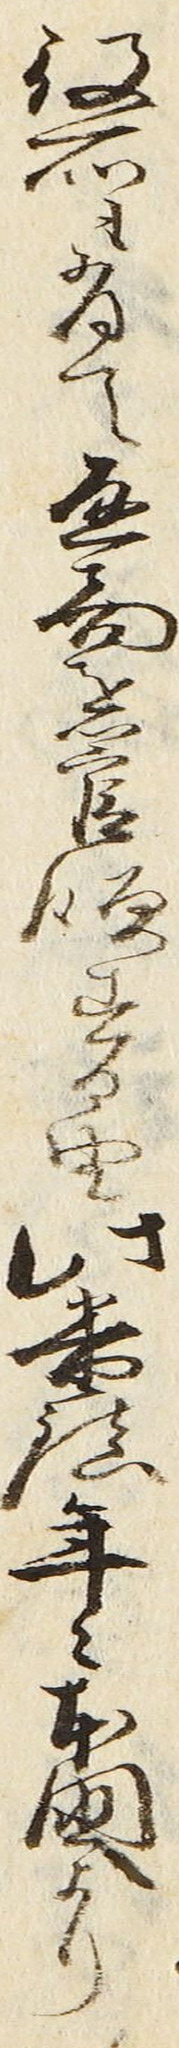役所も有て通商を以管領する由此番鎮年々本国より
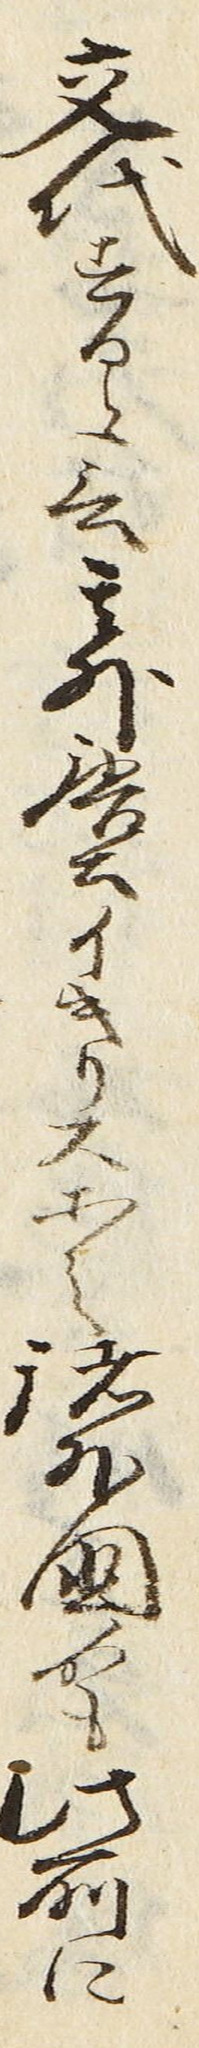交代すると云其外唐土イキリス等之諸外国ゟも此所に
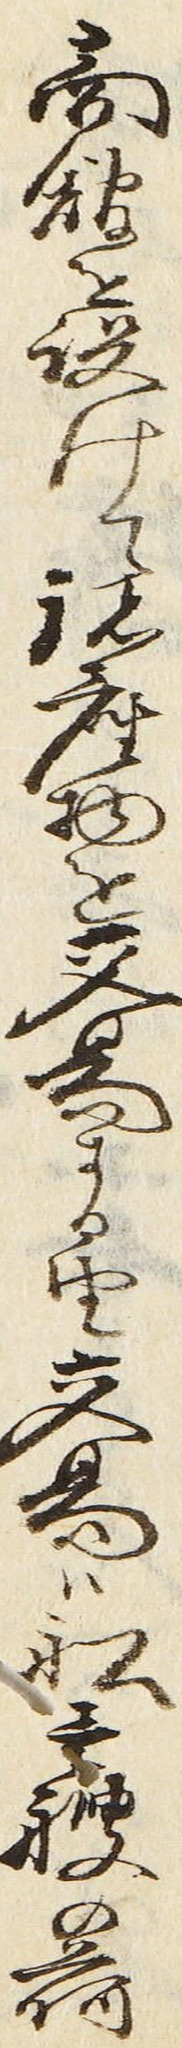商館を設けて諸産物を交易する由交易ハ船壱艘の荷
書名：亜墨利加漂流記聞
